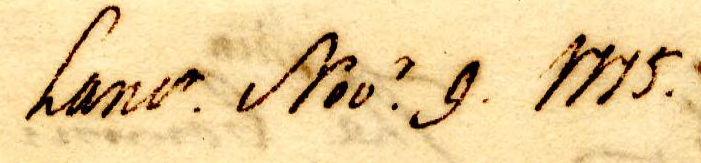Lanc^r. Nov^r. 9. 1775.
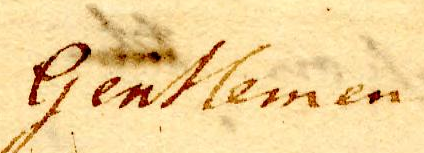Gentlemen
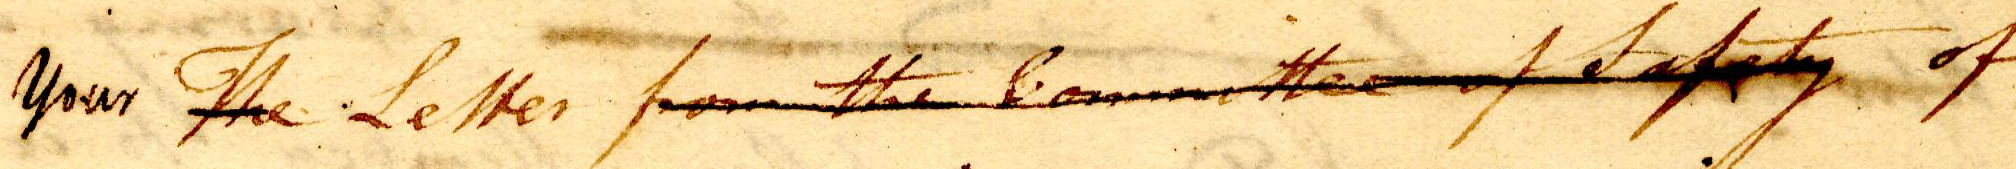Your [The] Letter [from the Committee of Safety] of
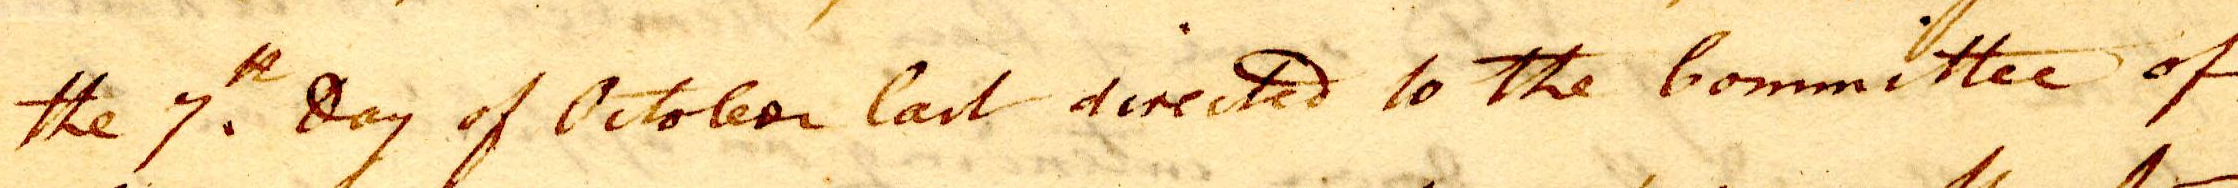the 7^th. day of October last directed to the Committee of
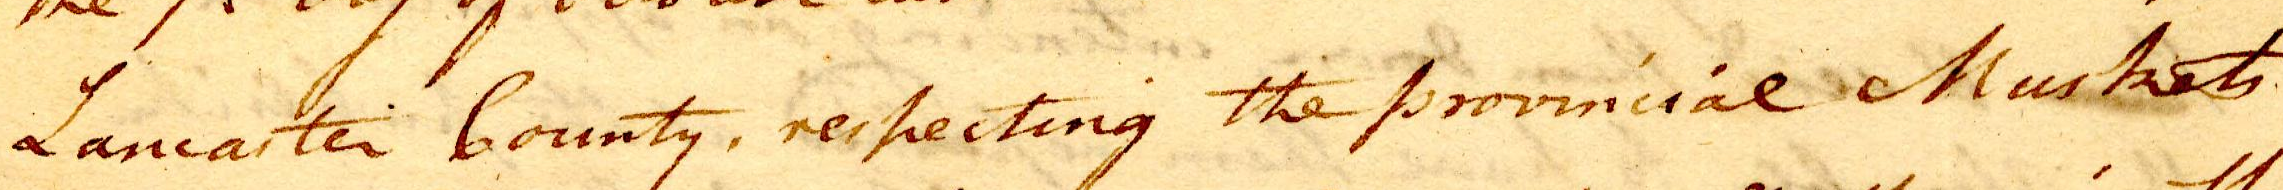Lancaster County, respecting the provincial Muskets
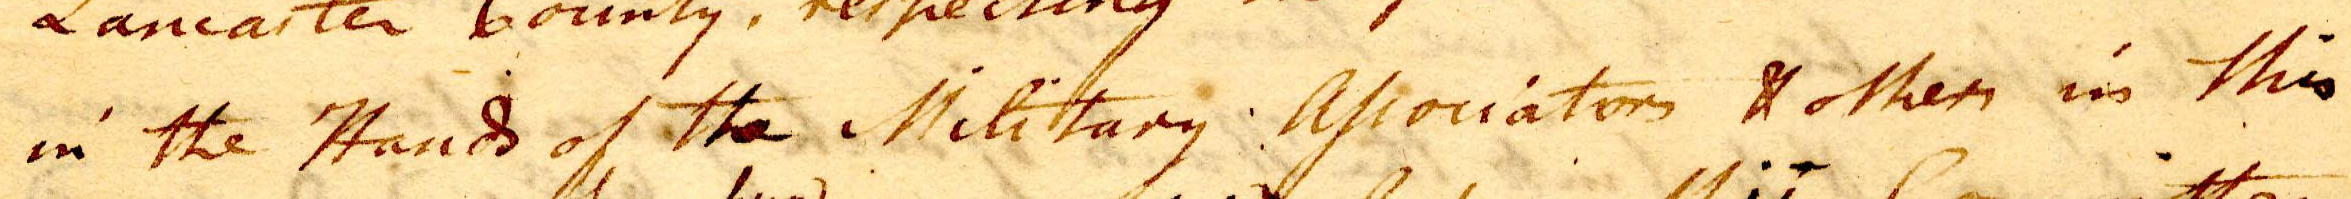in the Hands of the Military Associators & others in this
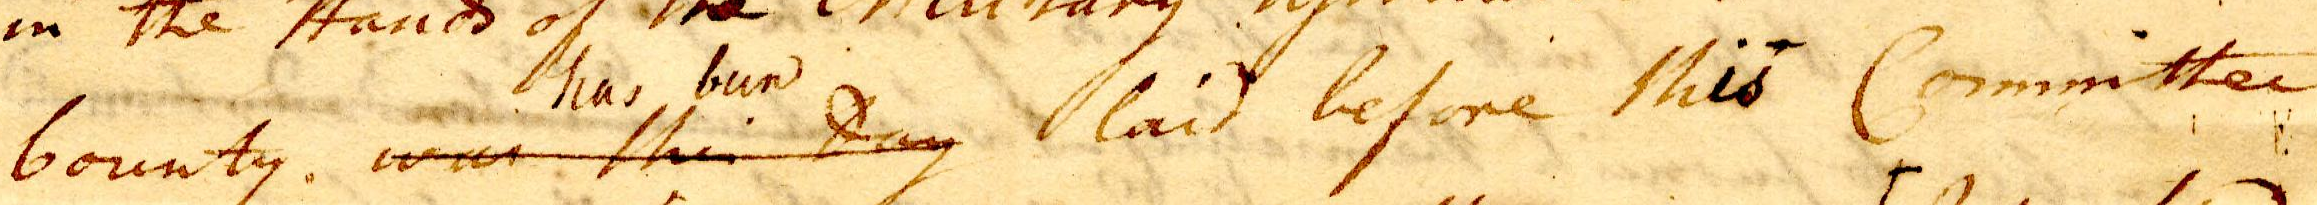County [was this Day] ^ laid before this Committee
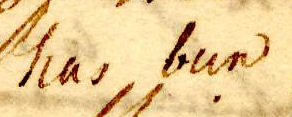has been
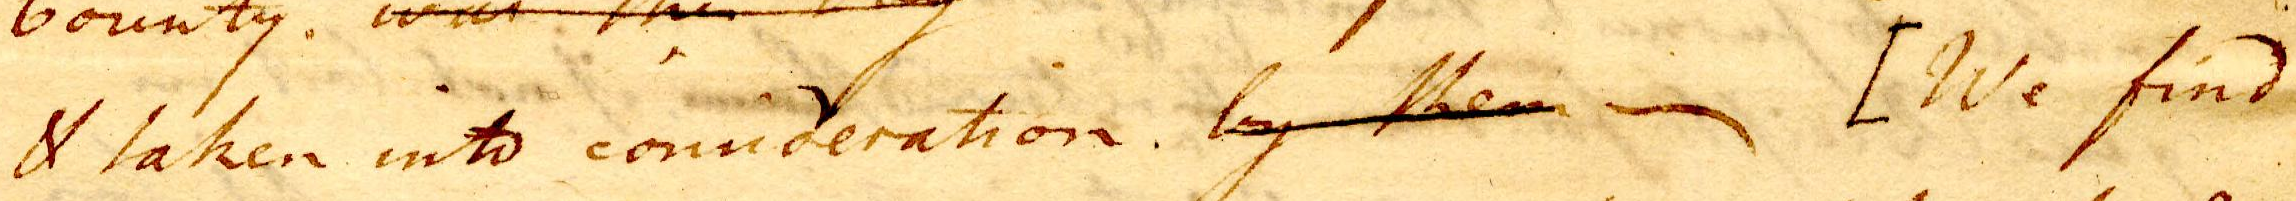& taken into consideration [by them]- (We find
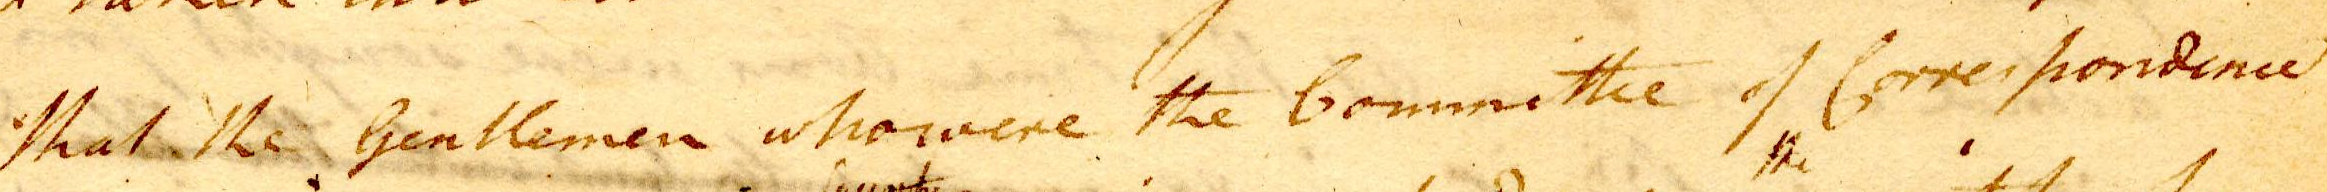that the Gentlemen who were the Committee of Correspondence
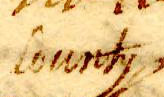Country
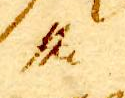the
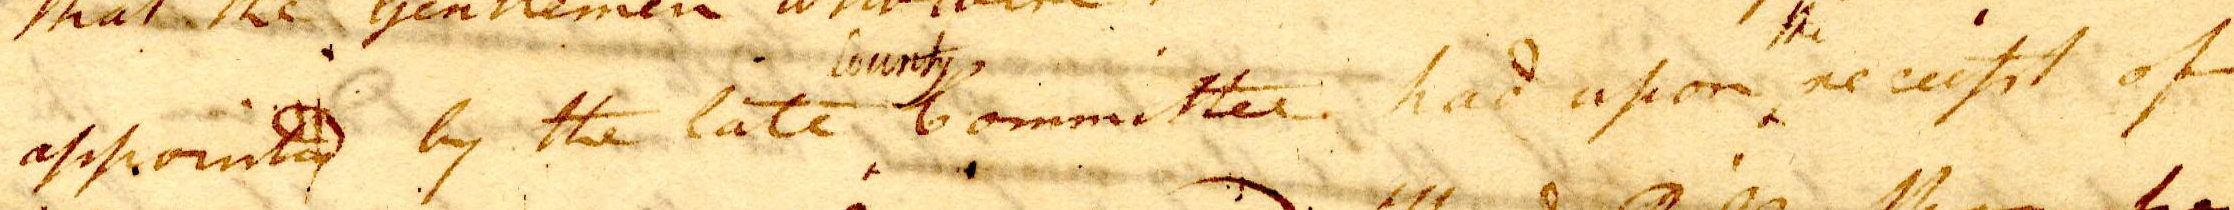appointed by the late ^ Committee had upon ^ receipt of
